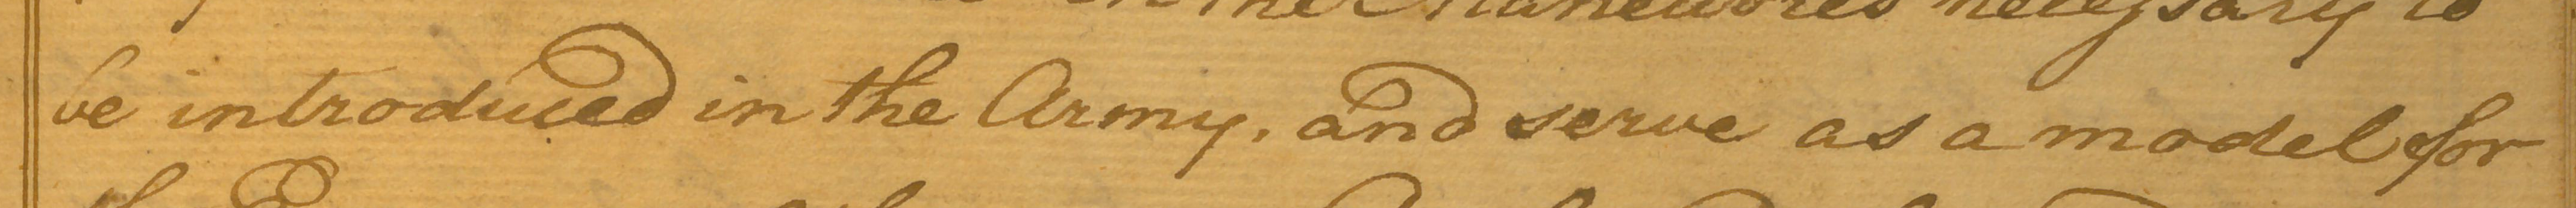be introduced in the Army, and serve as a model for
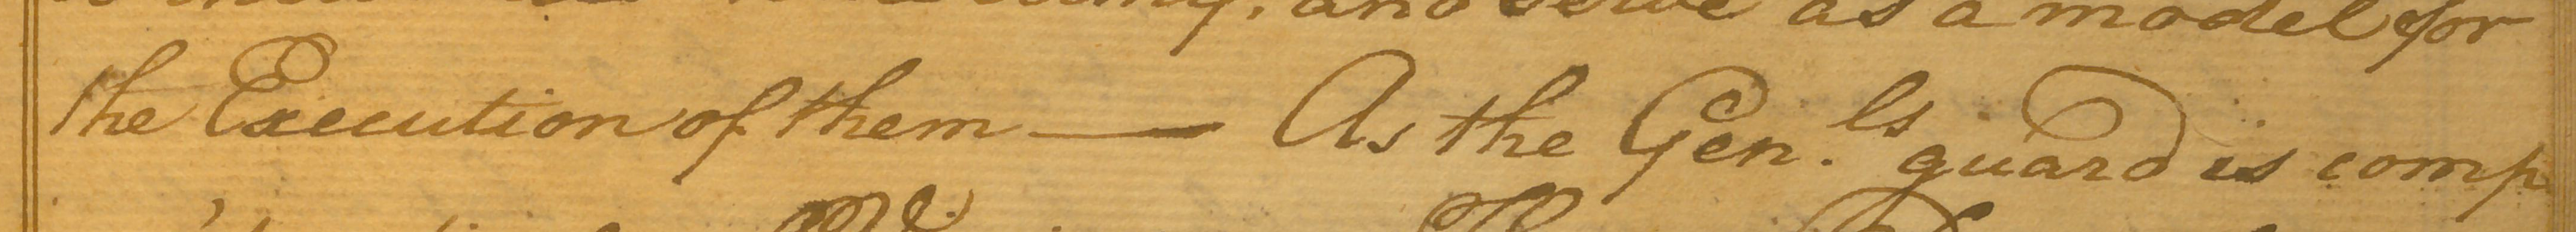the Execution of them- As the Gen^ls. guard is comp
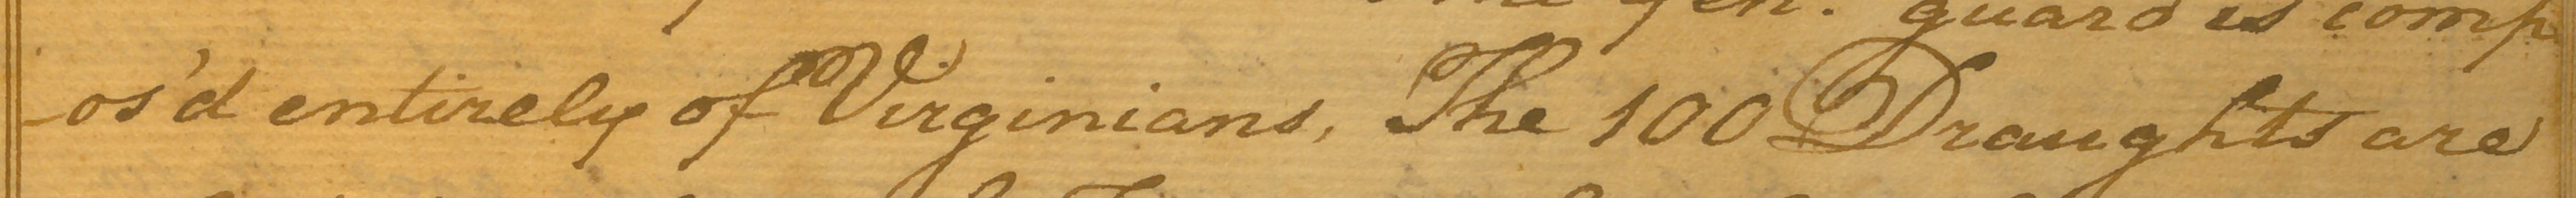-os'd entirely of Virginians, The 100 Draughts are
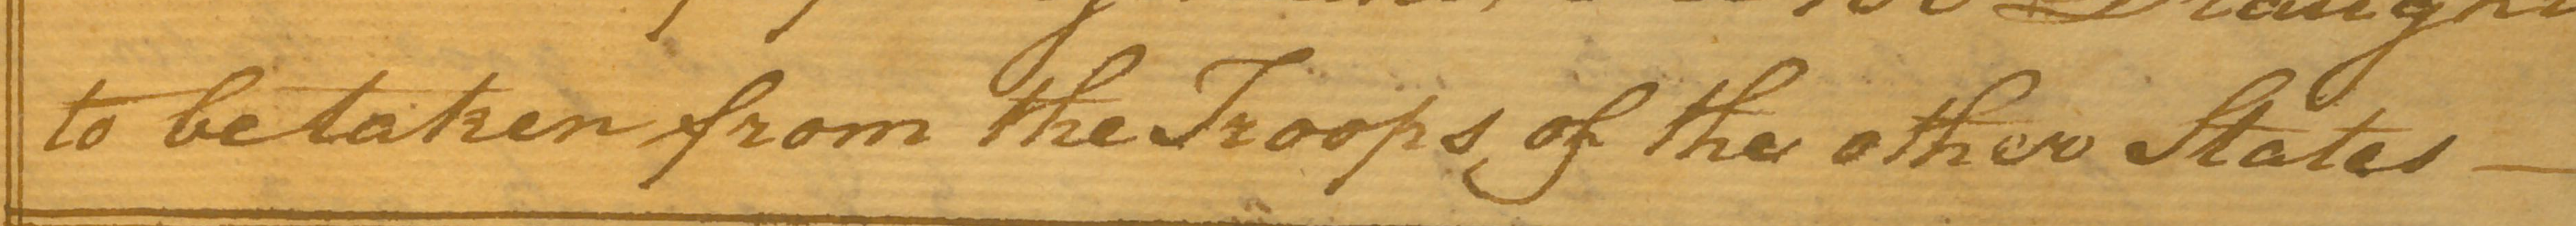to be taken from the Troops of the other States-
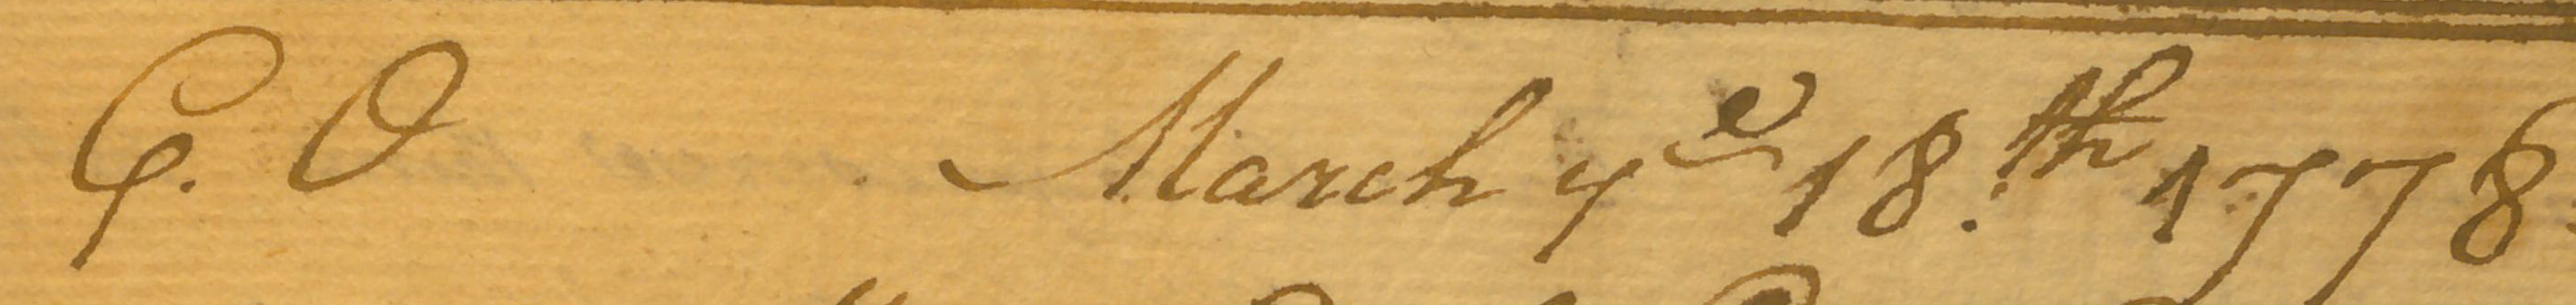G. O March y^e 18^th. 1778
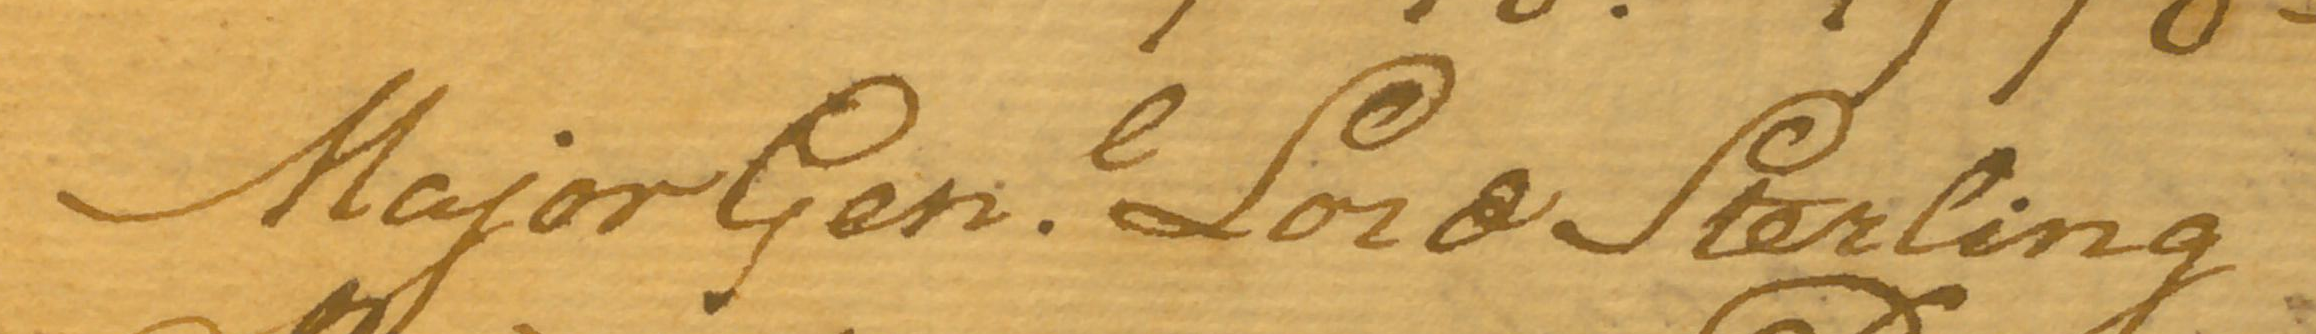Major Gen^l. Lord Sterling
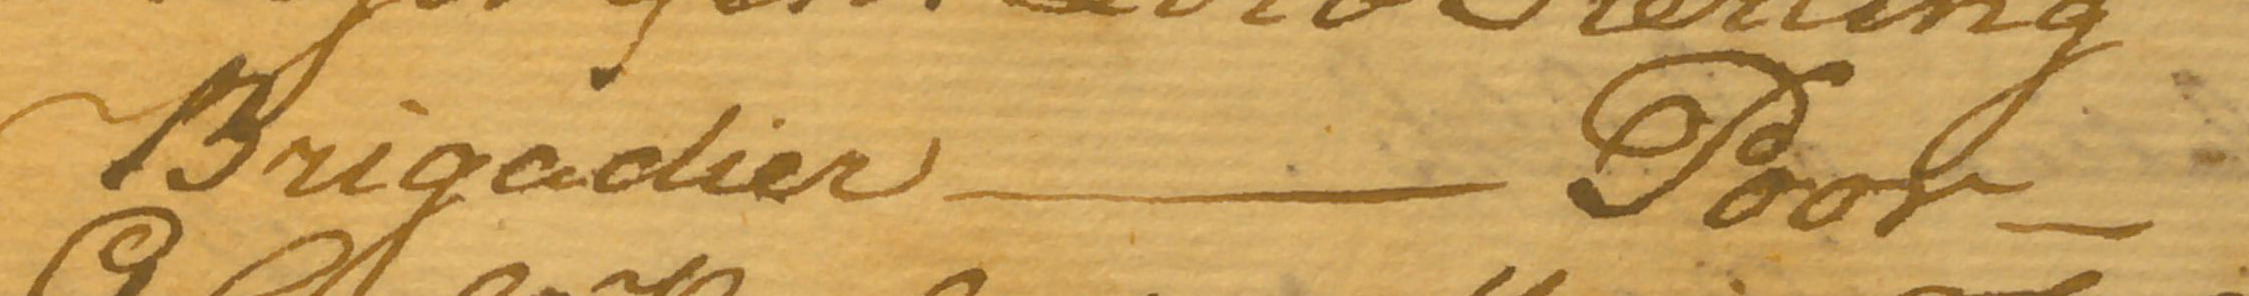Brigadier- Poor-
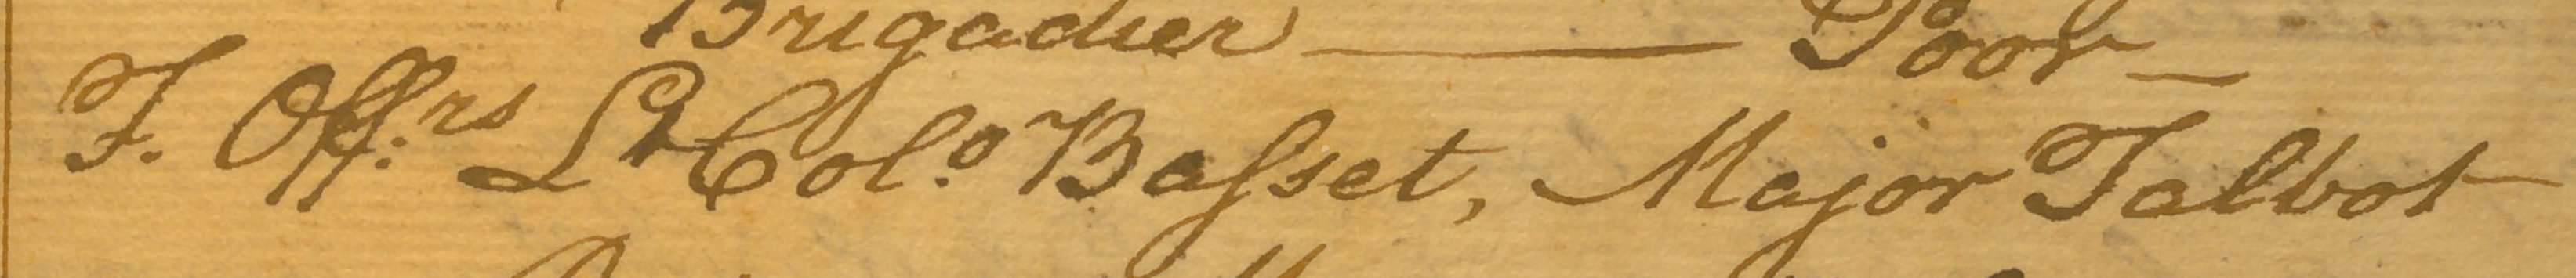F. Off^rs: L^t Ccol^o. Basset, Major Talbot
